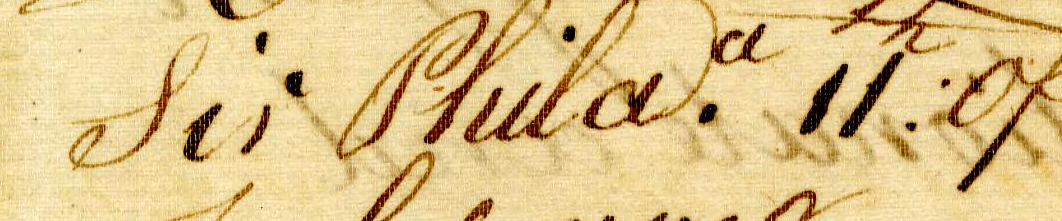Sir Phila^a. 11: of
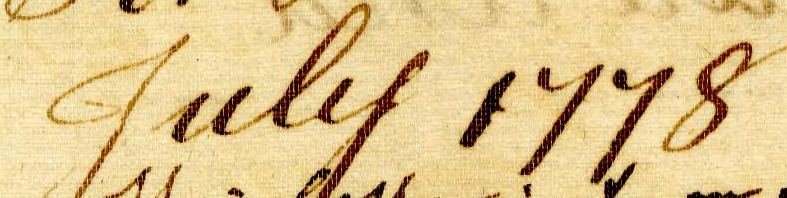July 1778
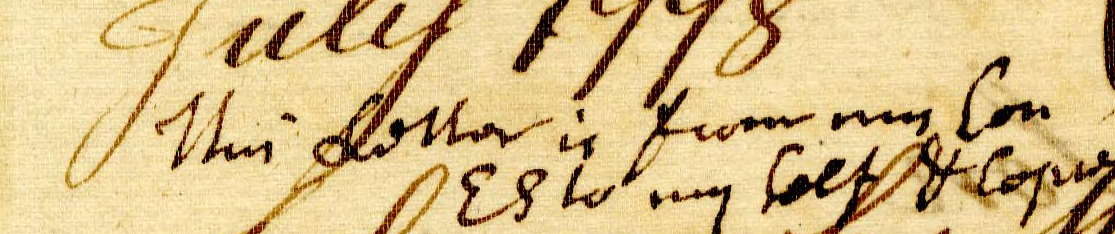This Letter is from my Son
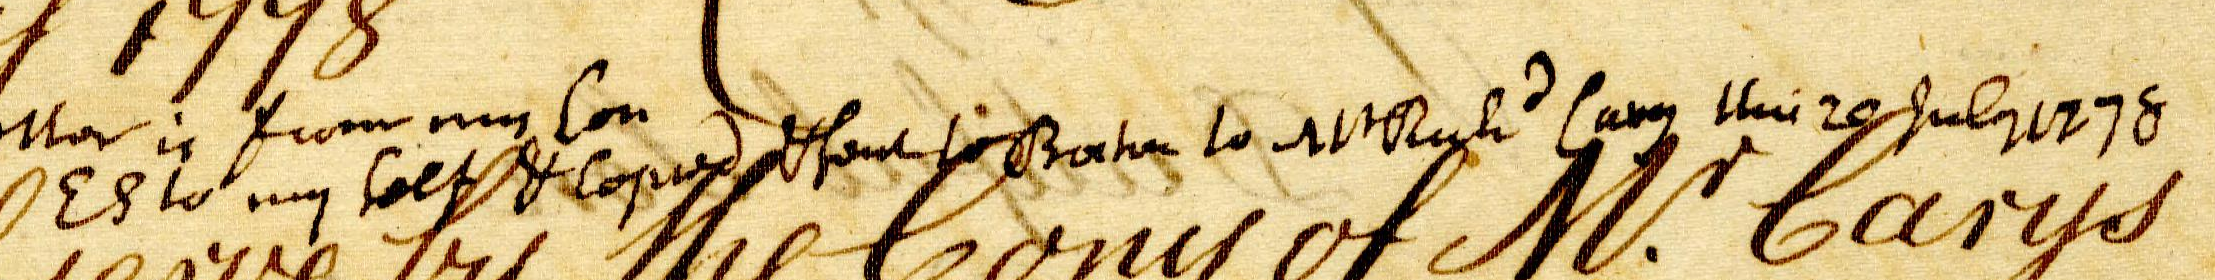ES to my Self & Copied & sent to Boston to M^r Rich^d Copy this 20 July 1778
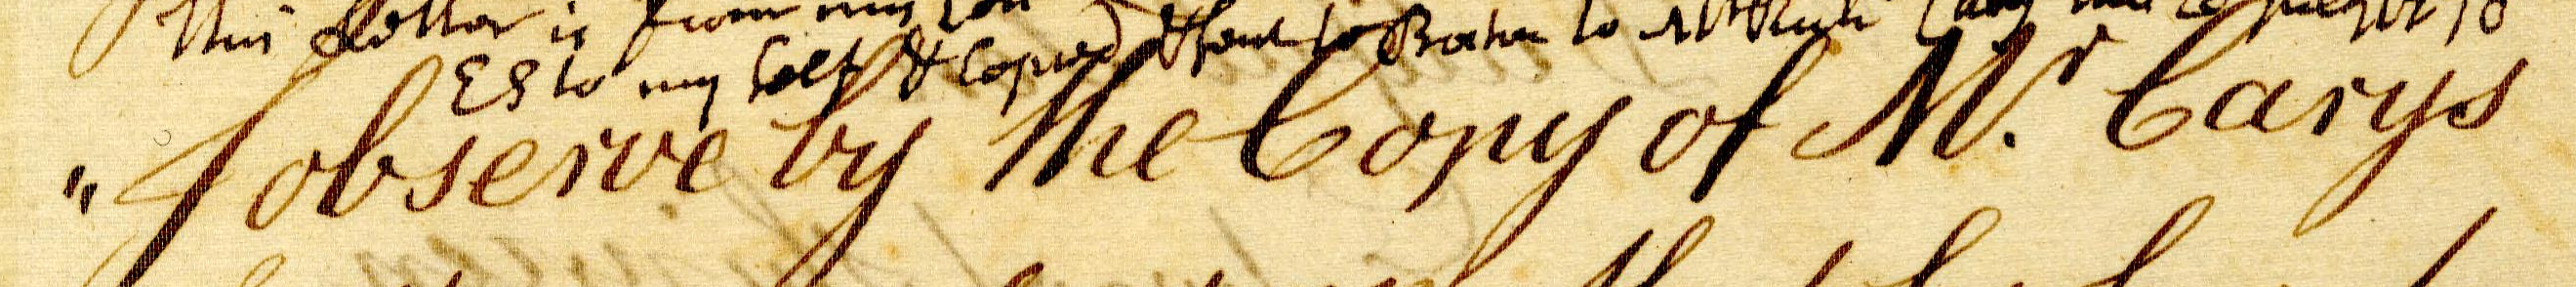"I observe by the Copy of M^r. Carys
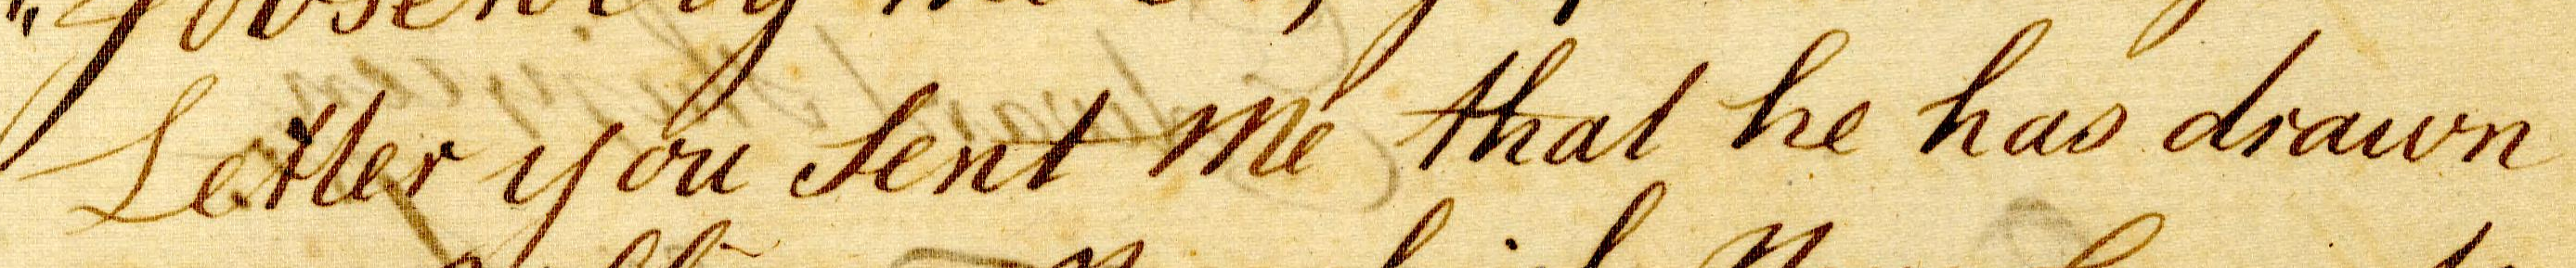Letter You sent me that he has drawn
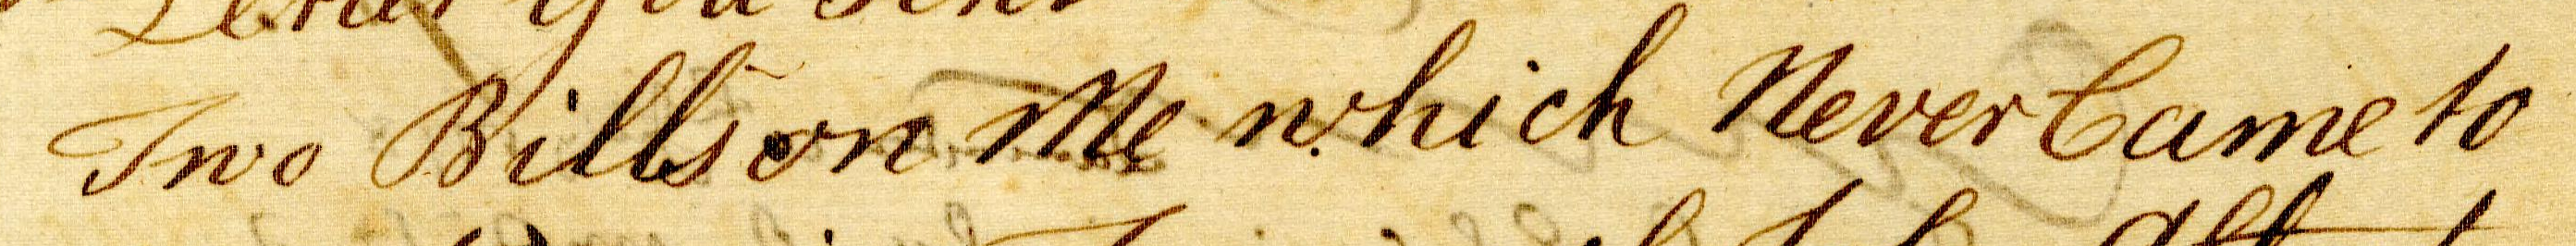Two Bills on Me which Never Came to
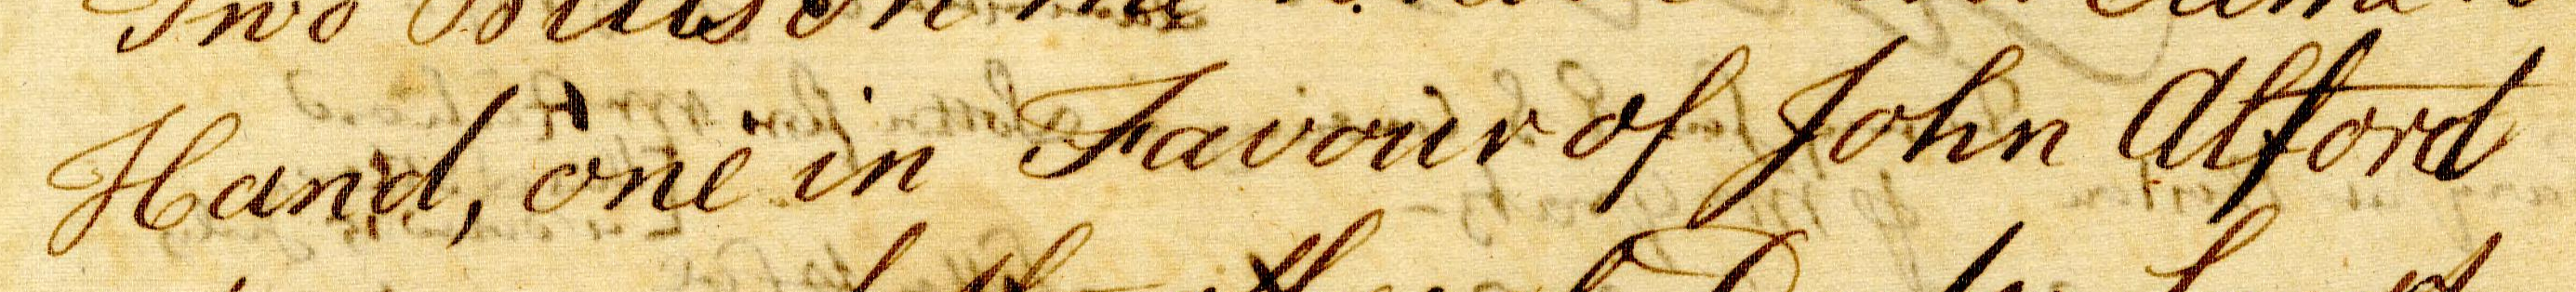Hand, one in Favour of John Alford
